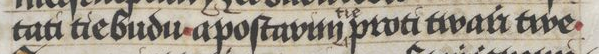tati tie budu.a poſtavim tie proti twaṙi twe.
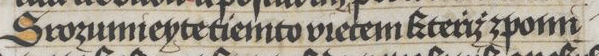Srozumieytetiemto viecem kteṙíž zpomí¬
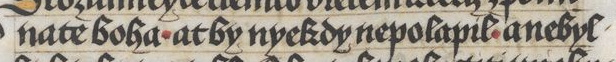nate boha.at by nyekdy nepolapil.a nebyl¬
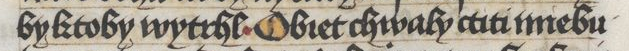by ktoby wytrhl.Obiet chwaly ctiti miebu¬
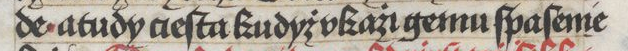de.atudy cieſta kudyż vkażi gemu ſpaſenie
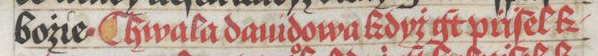božie.Chwala dauidowa kdyż ḡt pṙiẛel k
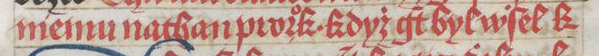níemu nathan pivi°k.když ḡt byl wẛel k
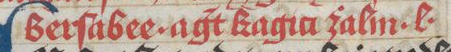berſabee.a ḡt kagici žalm.l.
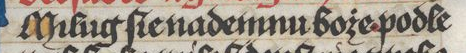Milug ſie nademnu boże.podle
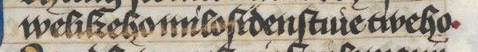welikeho miloſrdenſtuie tweho.
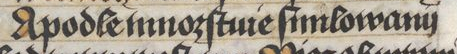Apodle mnozſtuíe ſmilowanij
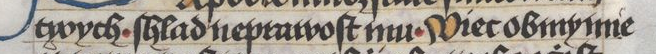twych.ſhlad neprawoſt mu.Viec obmymie
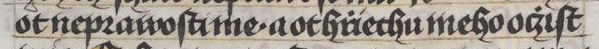ot neprawoſti me.a ot hṙíechu meho ocżiſt
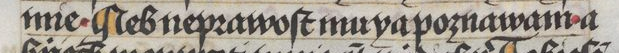mie.Neb neprawoſt mu ya poznawam.a
